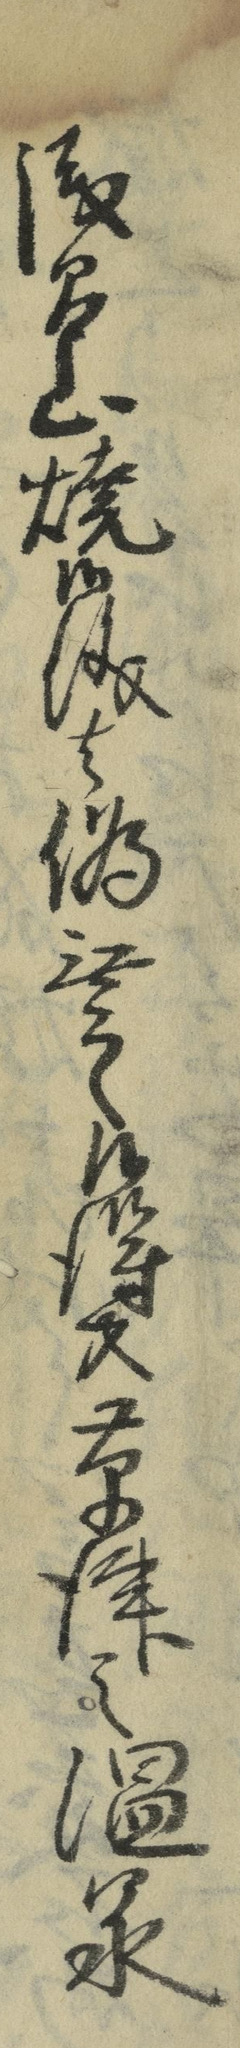一浅間山焼候儀者偽無御座候又草津之温泉
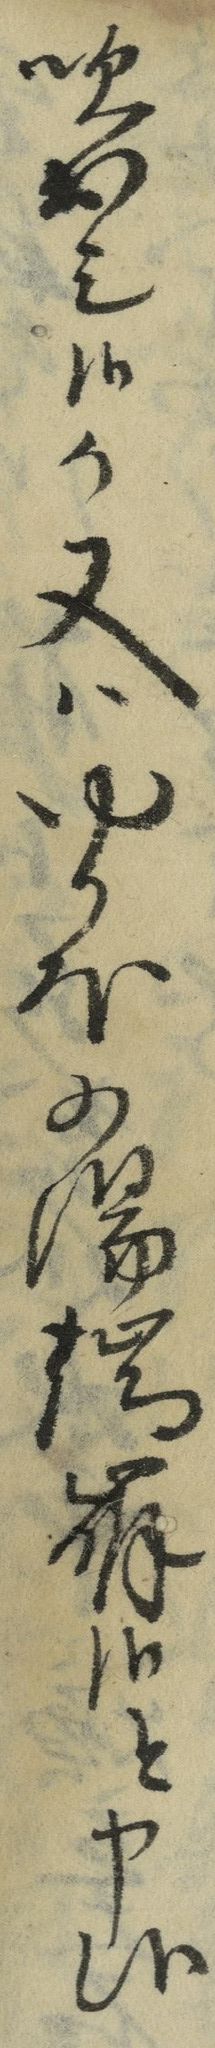吹出シ候か又ハゆかほの湯端崩候と申候
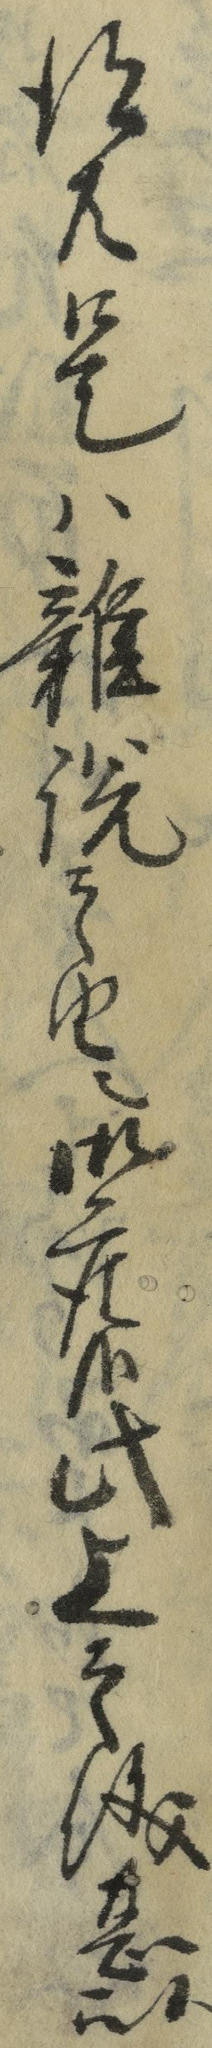得共是は雑説之由に御座候此上之儀甚以
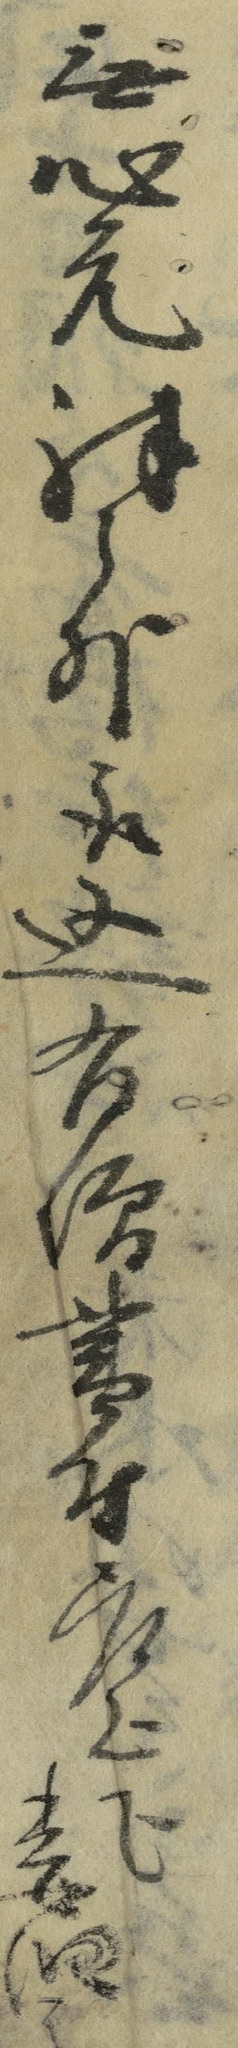無心元殊之外取込有増書付差上申候委細之
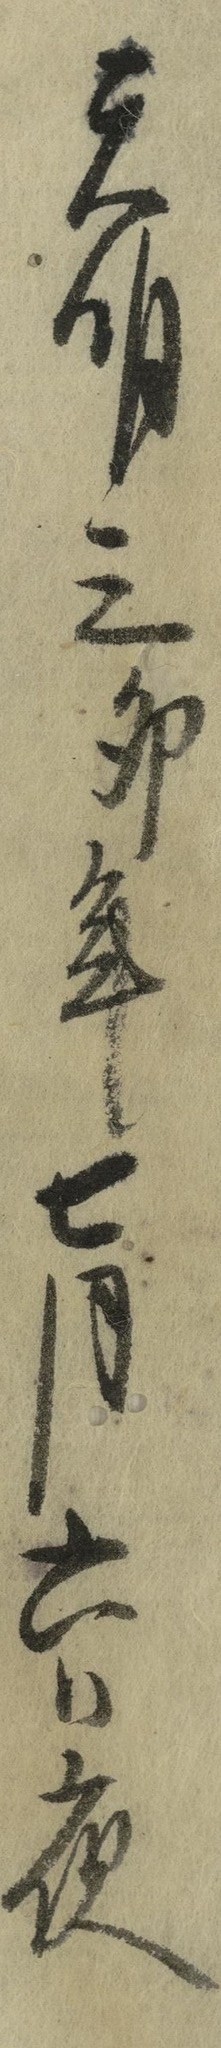天明三卯年七月六日夜
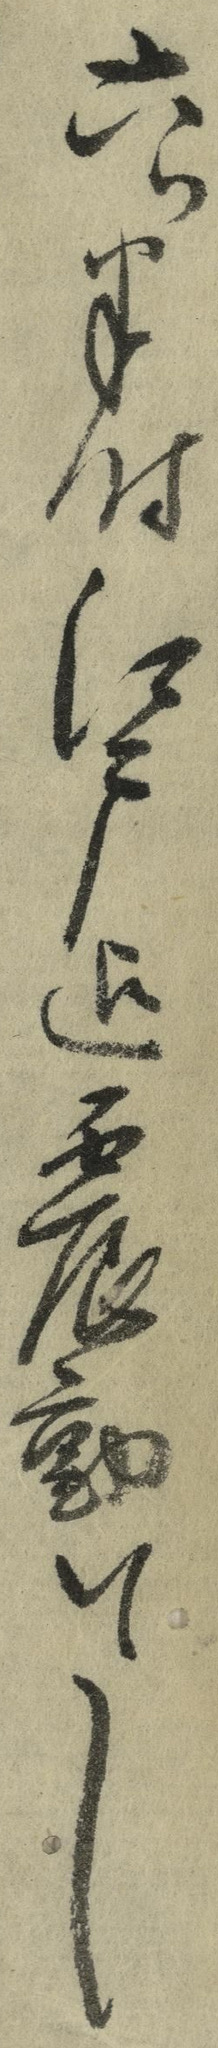六ツ半時江戸迄震動いたし
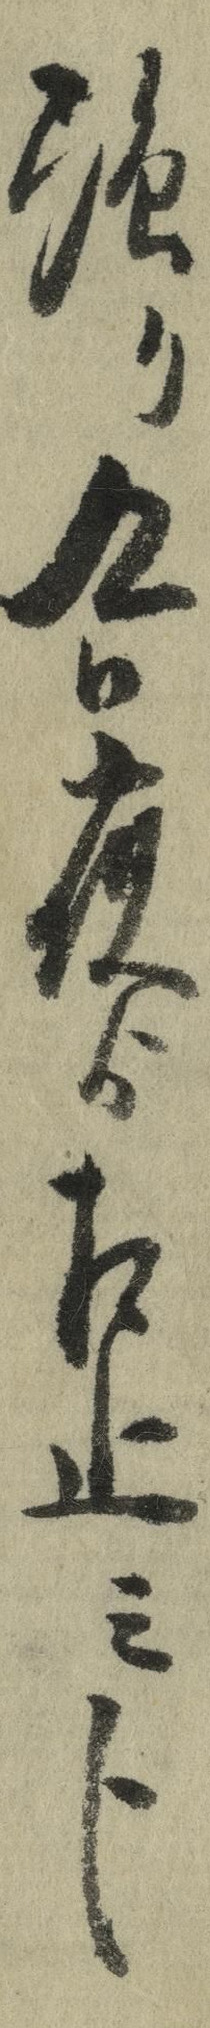強ク九日夜ゟ相止み申候
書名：天明三卯年七月　浅間山焼注進写
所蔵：東京大学地震研究所図書室 Earthquake Research Institute Library, The University of Tokyo, JAPAN
